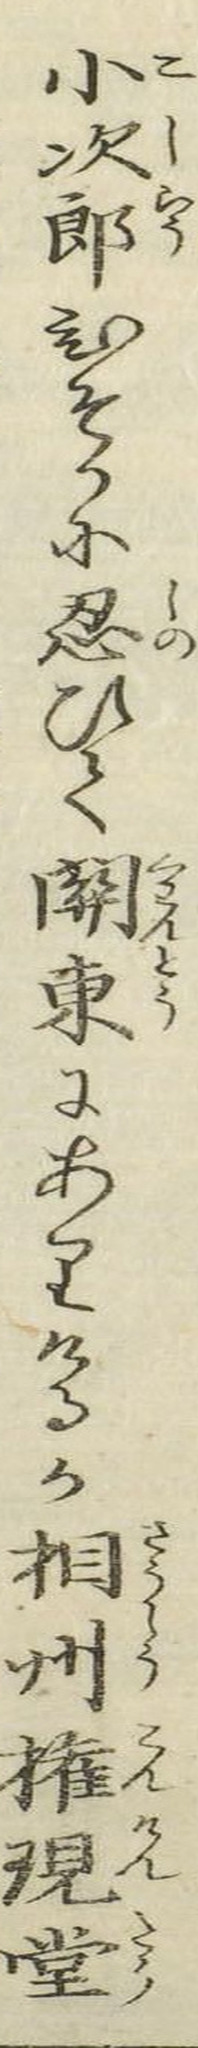小次郎ひそかに忍ひて關東にありけるか相州権現堂
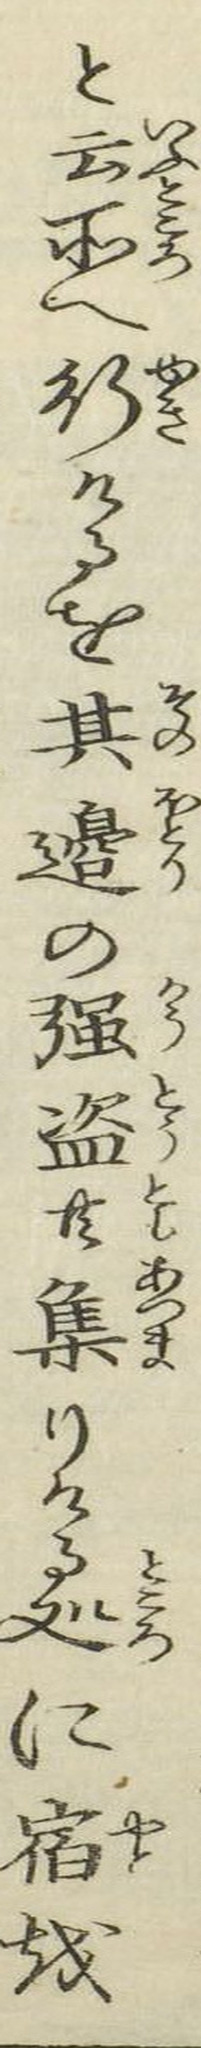と云所へ行けるを其邉の强盗共集りける処に宿を
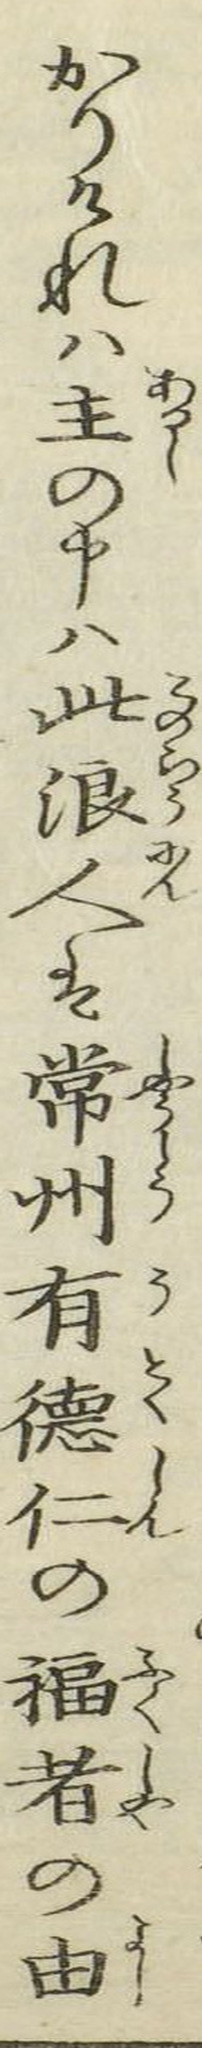かりけれは主の申は此浪人は常州有德仁の福者の由
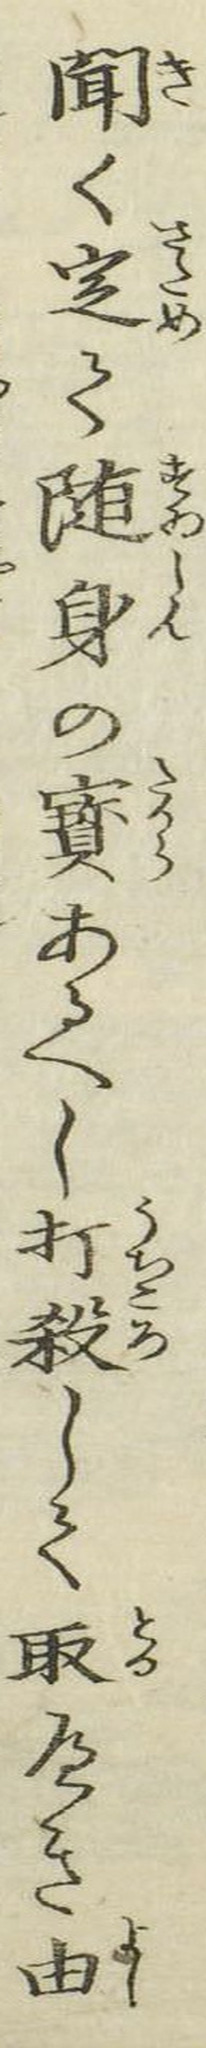聞く定て随身の寳あるへし打殺して取へき由
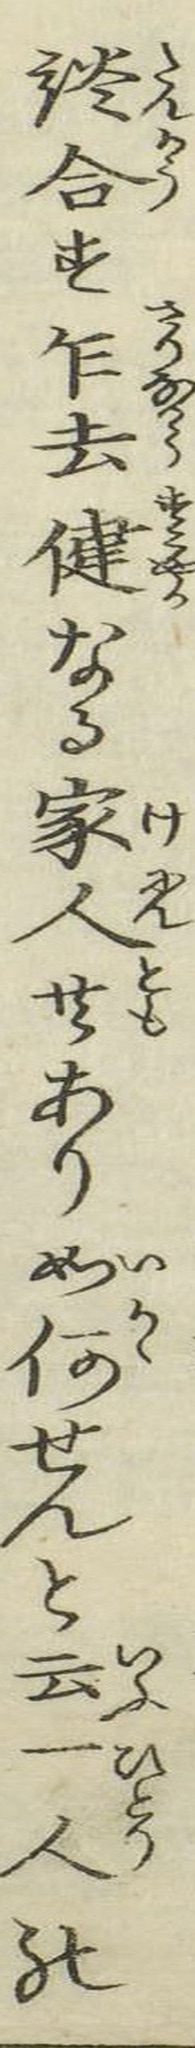談合す乍去健なる家人共あり如何せんと云一人の
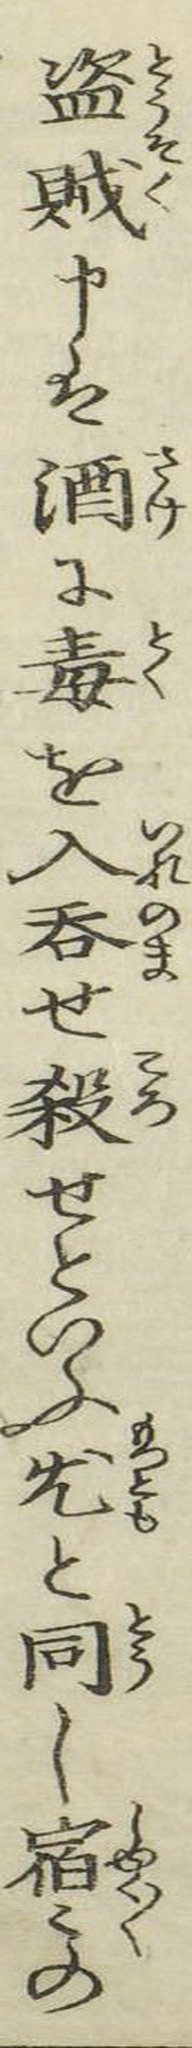盗賊申は酒に毒を入吞せ殺せといふ尤と同し宿々の
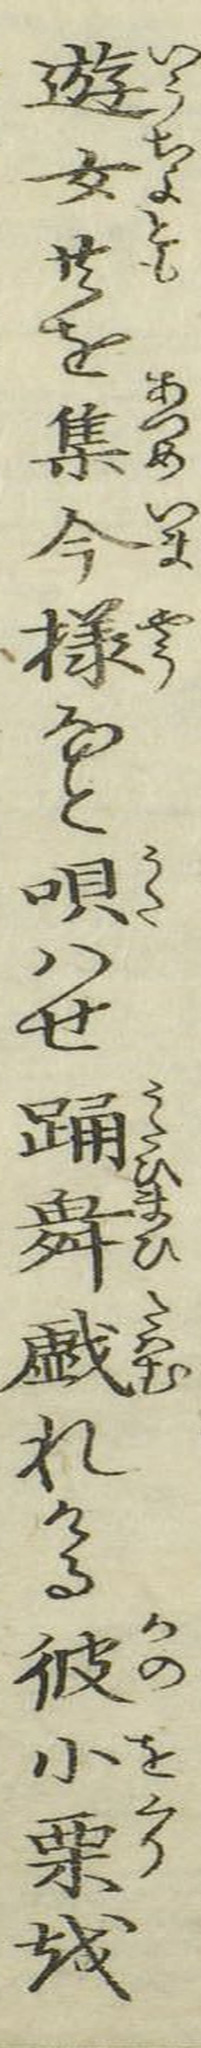遊女共を集今様なと唄はせ踊舞戯れける彼小栗を
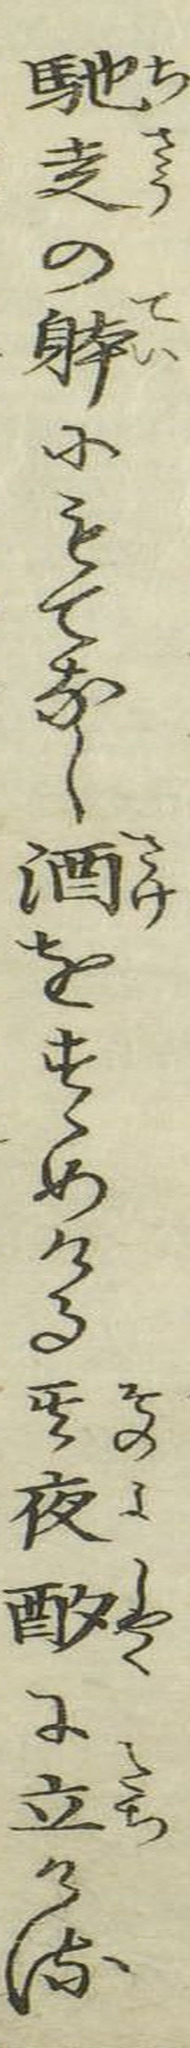馳走の躰にもてなし酒をすゝめける其夜酌に立ける
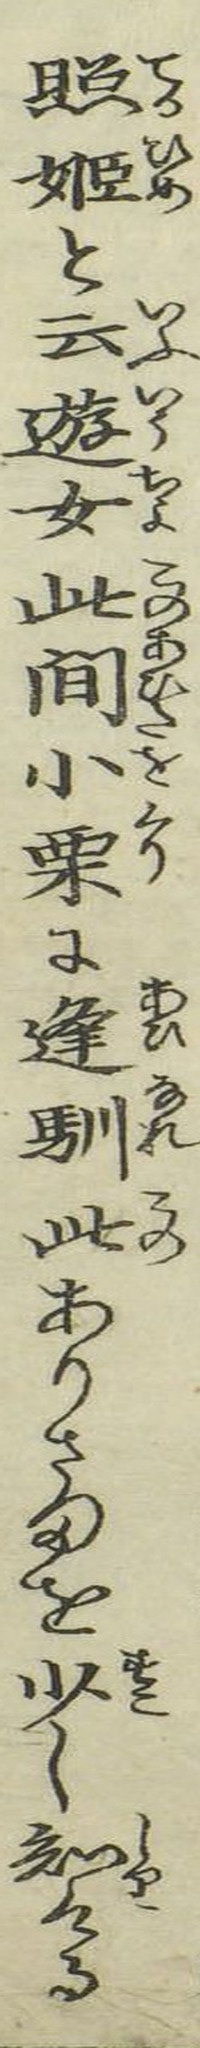照姫と云遊女此間小栗に逢馴此ありさまを少し知ける

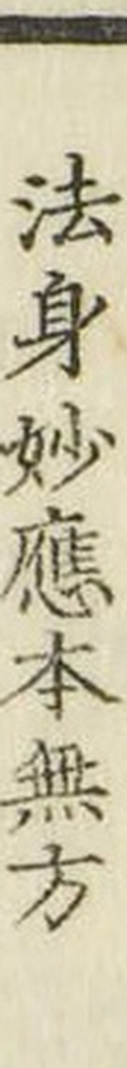法身妙應本無方
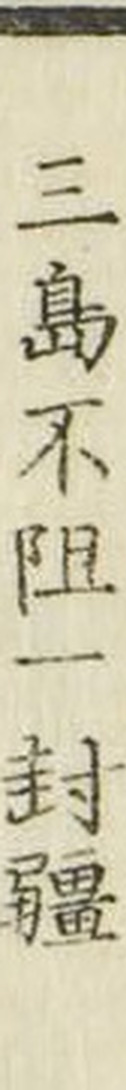三島不阻一封疆
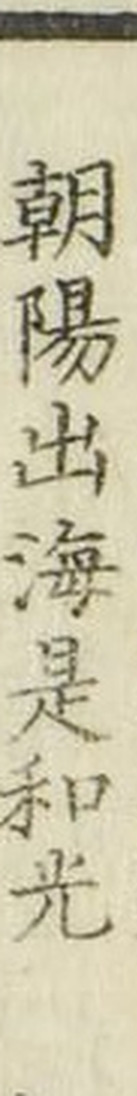朝陽出海是和光
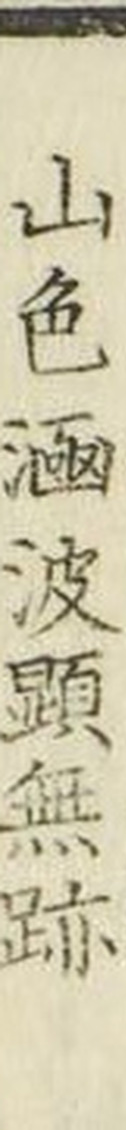山色涵波顕無跡
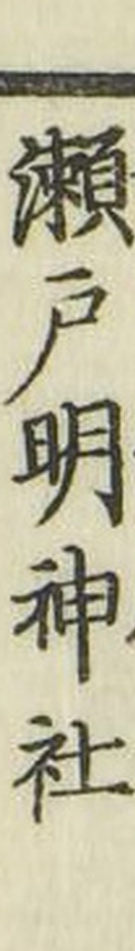瀬戸明神社

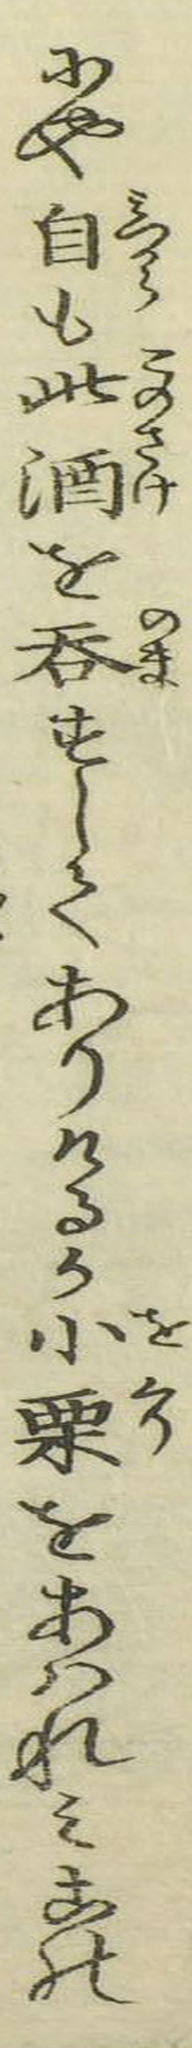にや自も此酒を吞すしてありけるか小栗をあはれみこの
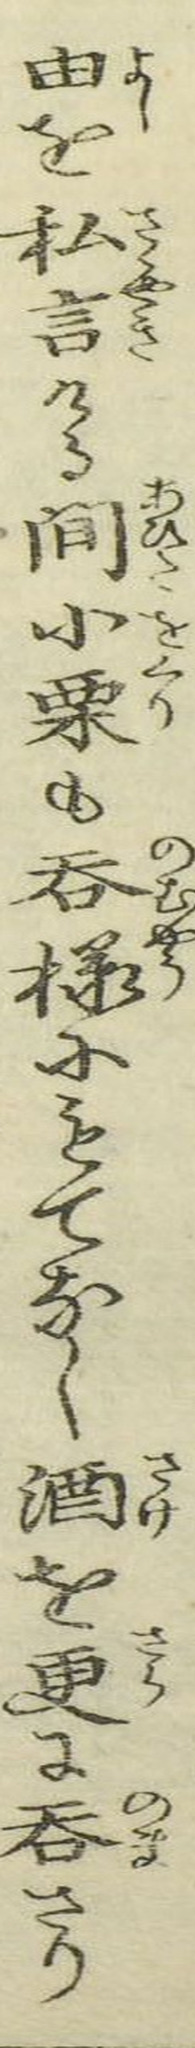由を私言ける間小栗も吞様にもてなし酒を更に吞さり
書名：江戸名所図会 20巻 巻之6
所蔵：東京学芸大学教育コンテンツアーカイブ
